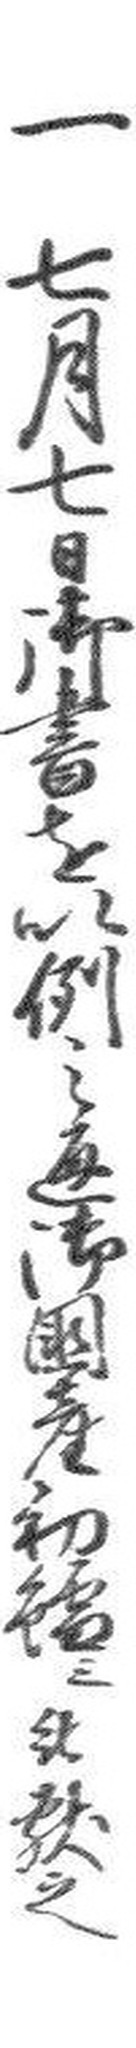一七月七日御書を以例之通御国産初鱈三被献之
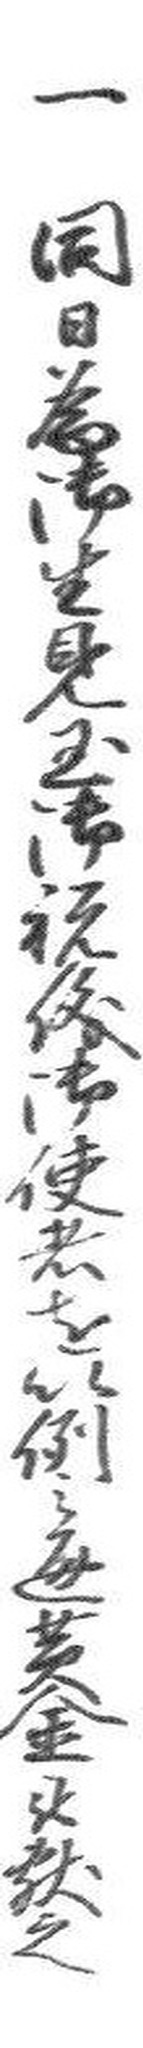一同日為御生見玉御祝儀御使者を以例之通黄金被献之
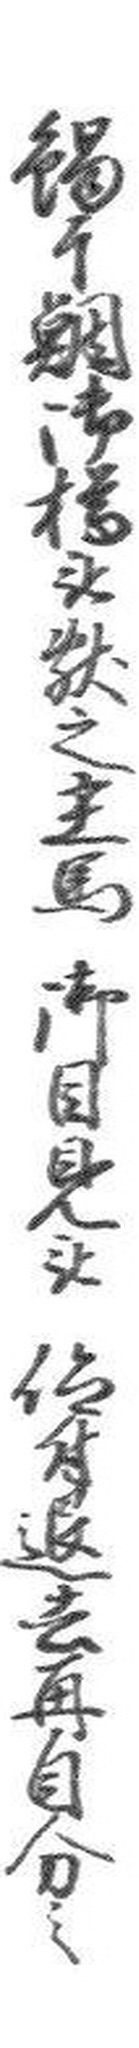鯣干鯛御樽被献之主馬御目見被仰付退去再自分之
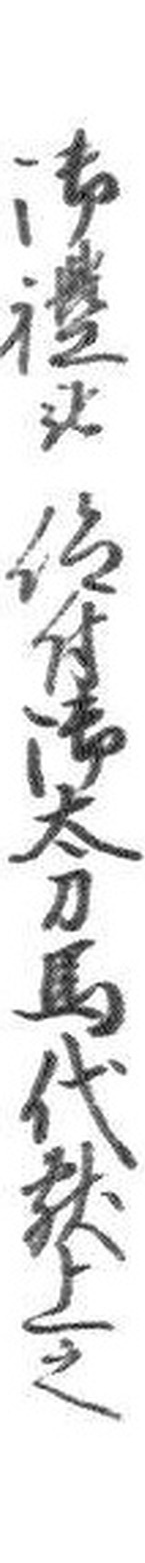御礼被仰付御太刀馬代献上之
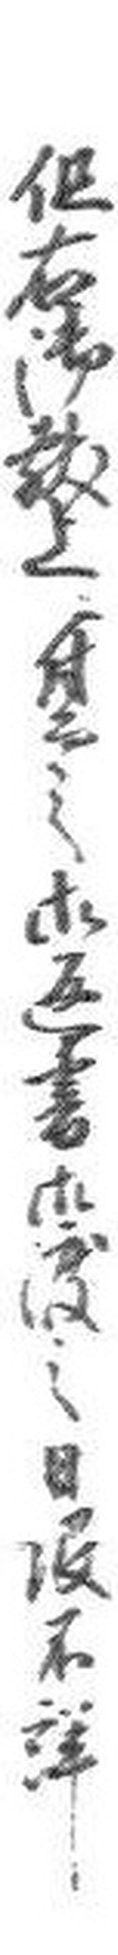但右御献上ニ付而之御返書御渡之日限不詳

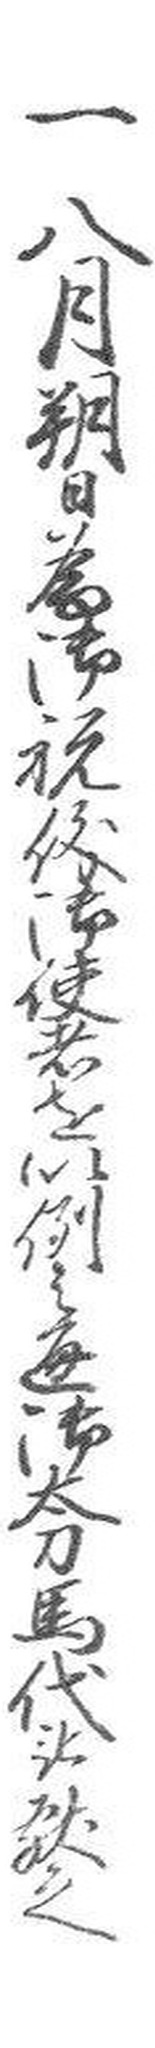一八月朔日為御祝儀御使者を以例之通御太刀馬代被献之
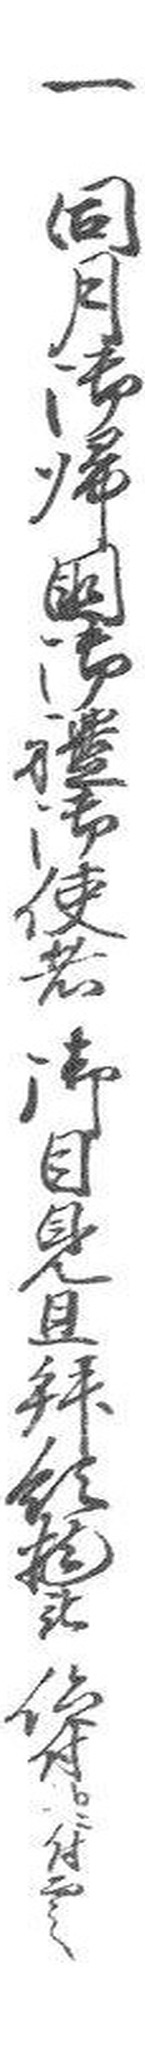一同月御帰国御礼御使者御目見且拝領物被仰付候ニ付而之
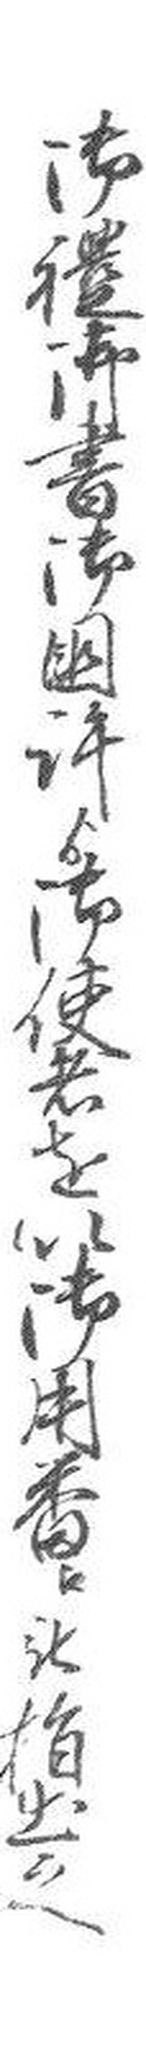御礼御書御国許ゟ御使者を以御用番江被指出之
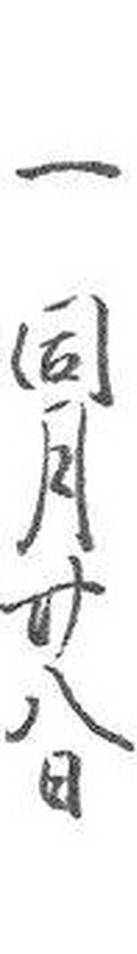一同月廿八日
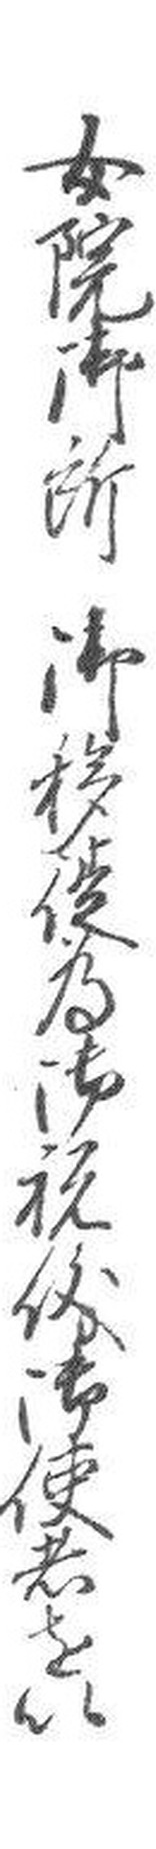女院御所御移徙為御祝儀御使者を以
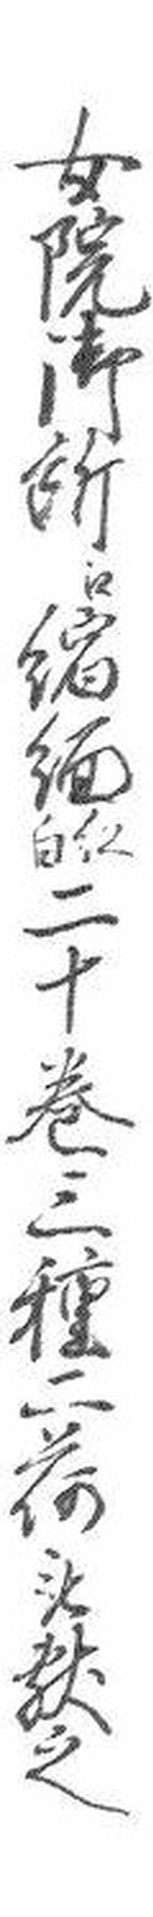女院御所江縮緬紅白二十巻三種二荷被献之
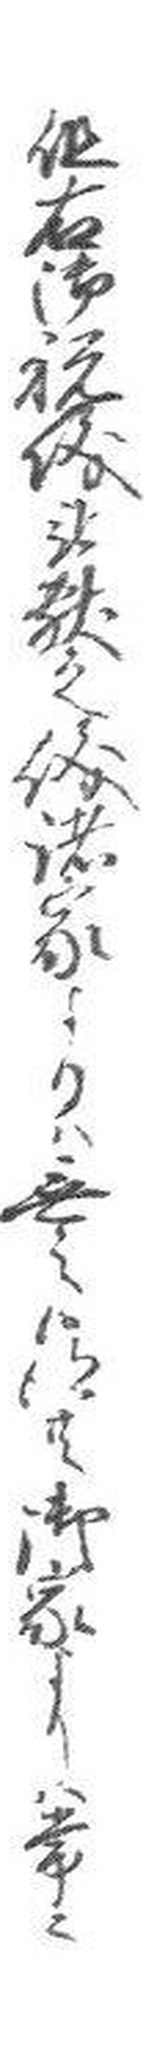但右御祝儀被献之儀諸家よりは無之候得共御家よりは常ニ
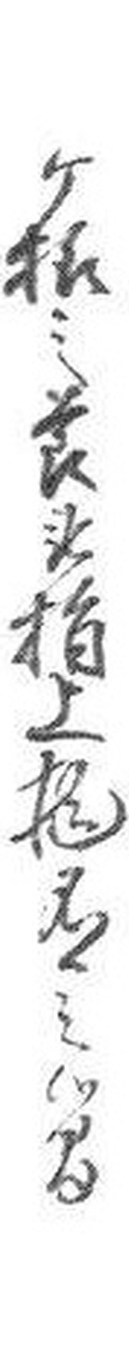ケ様之節被指上遊有之候間
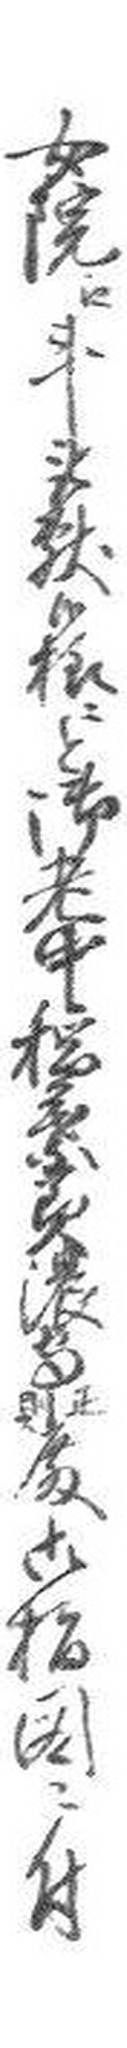女院江斗被献候様ニと御老中稲葉美濃守正則殿御指図ニ付
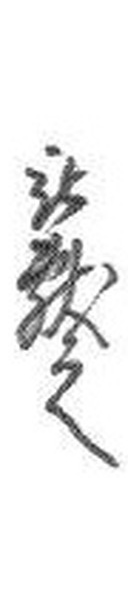被献之
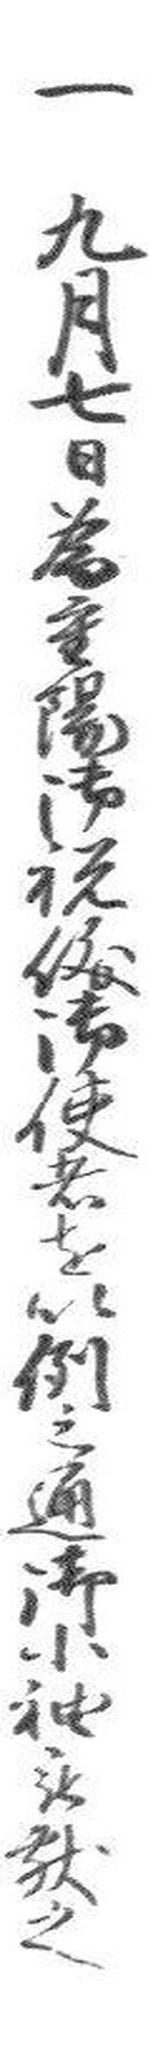一九月七日為重陽御祝儀御使者を以例之通御小袖被献之
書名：家譜 六 光通公 従万治三年到寛文三年
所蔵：福井県文書館 Fukui Prefectural Archives
